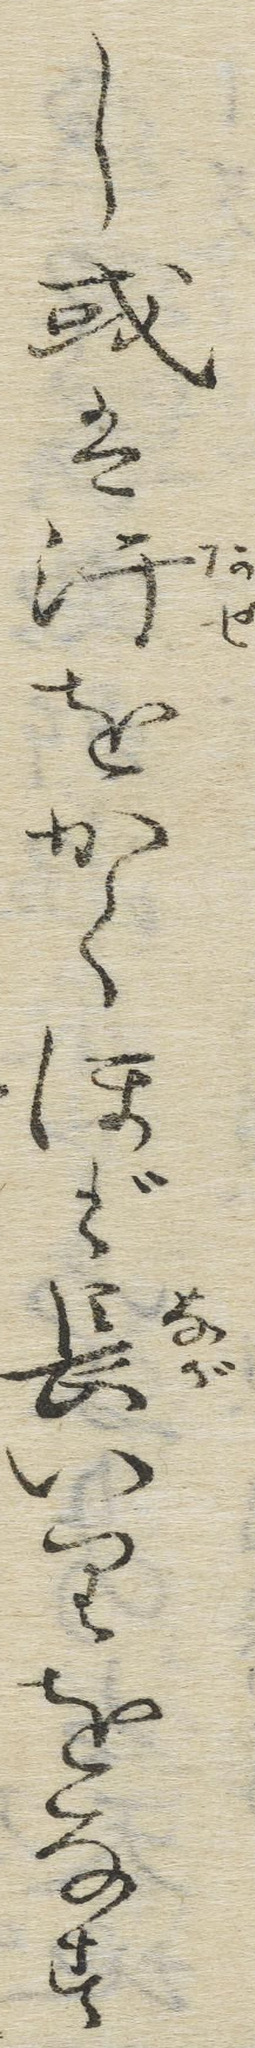し或は汗をかくほど長いりをなす
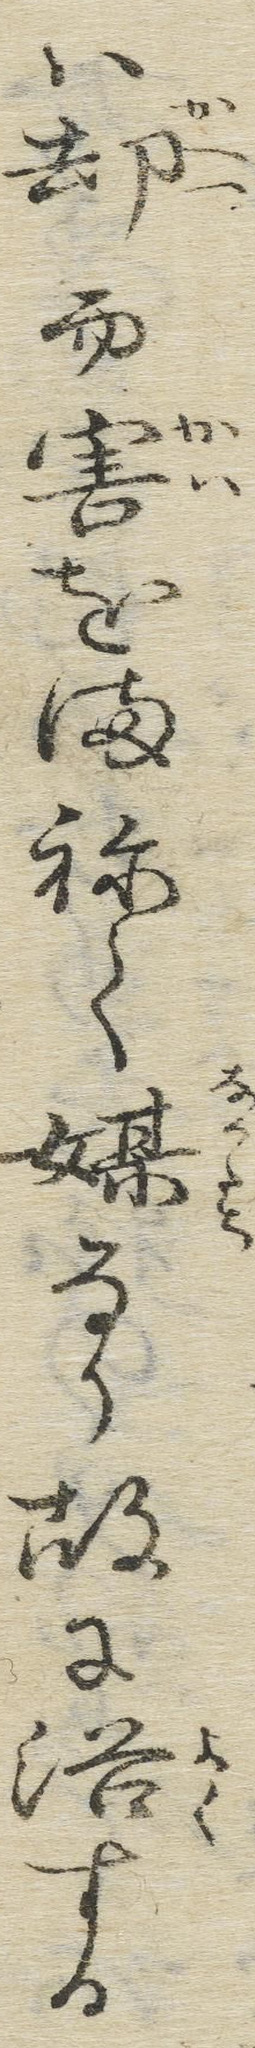は却而害をまねく媒なり故に浴する
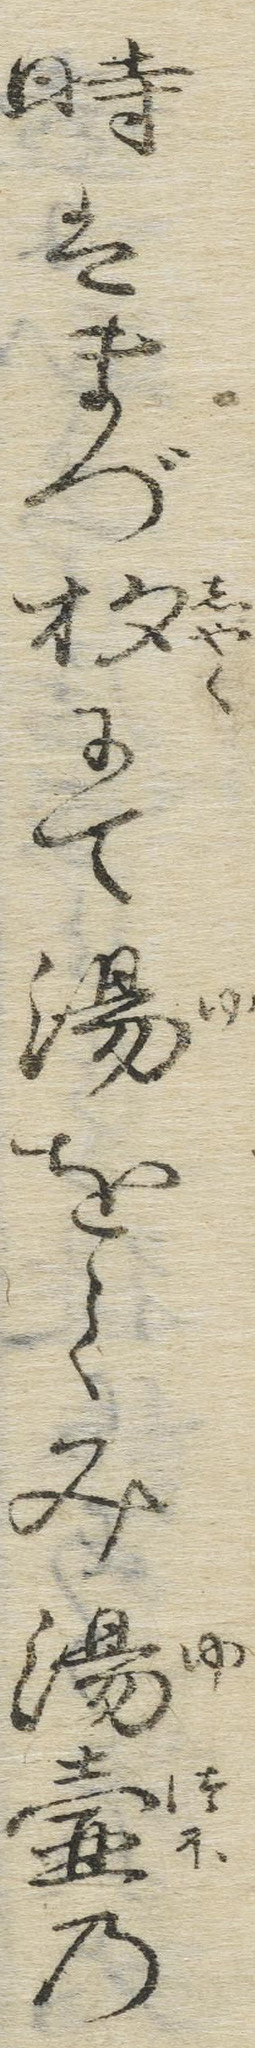時はまづ杓にて湯をくみ湯壺の
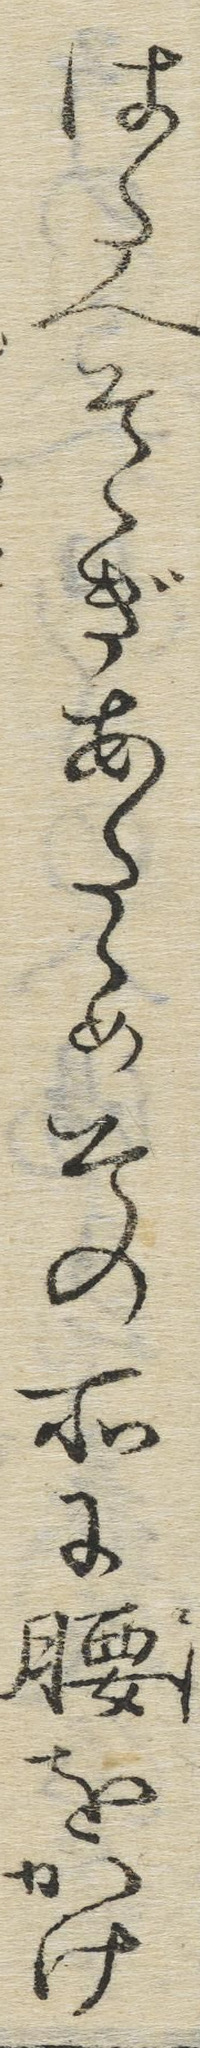はたへそゝぎあたゝめその所に腰をかけ
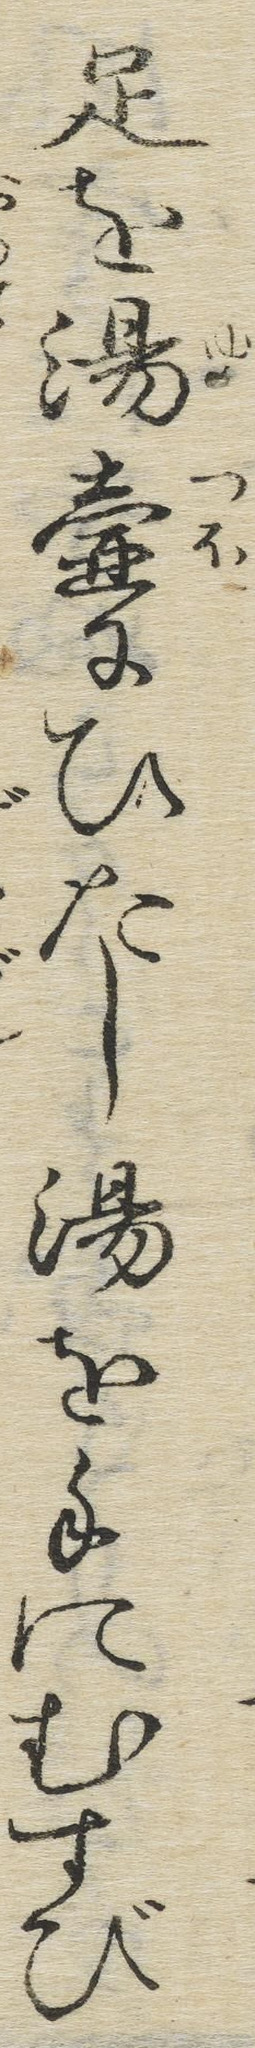足を湯壺にひたし湯を手にむすび
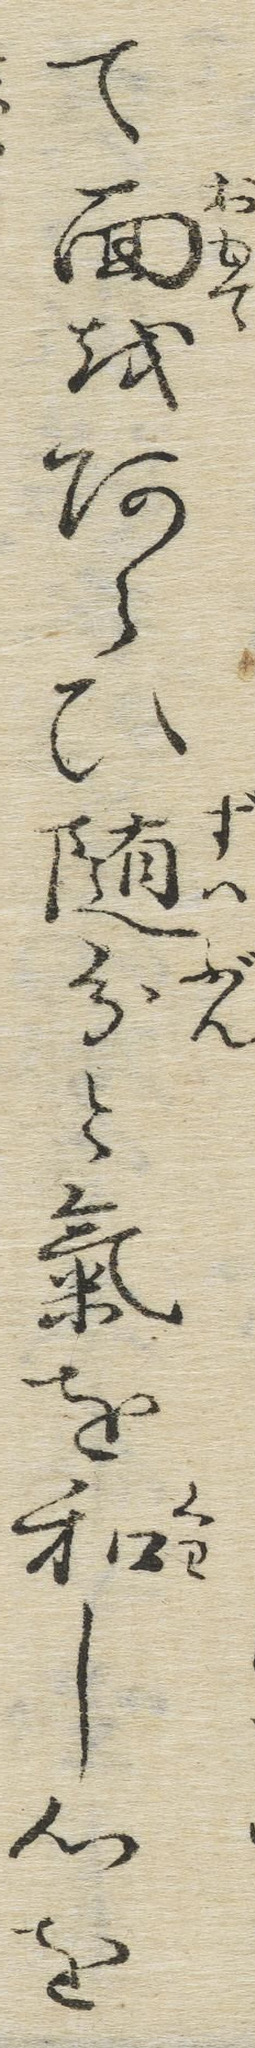て面をあらひ随分と気を和し心を
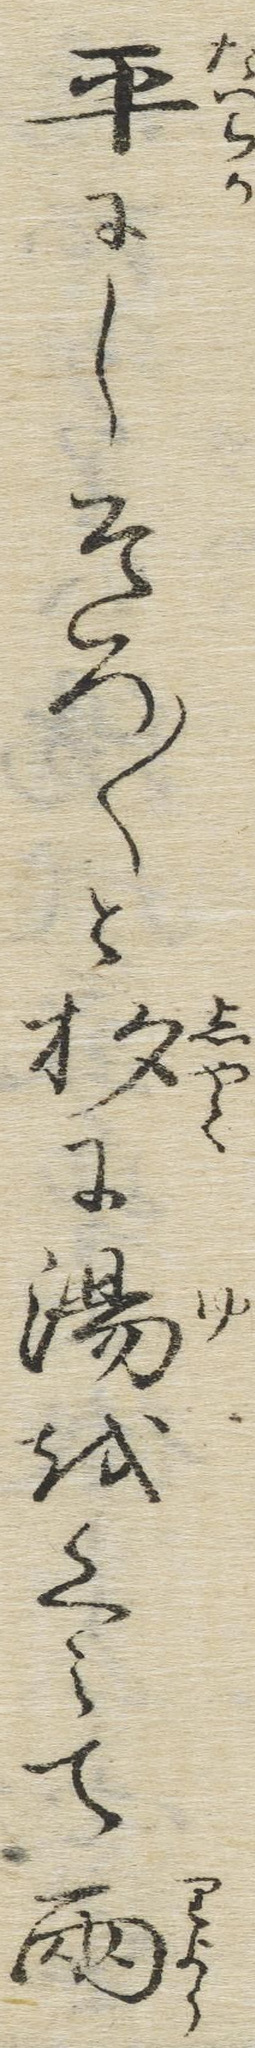平にしそろ〳〵と杓に湯をくみて両
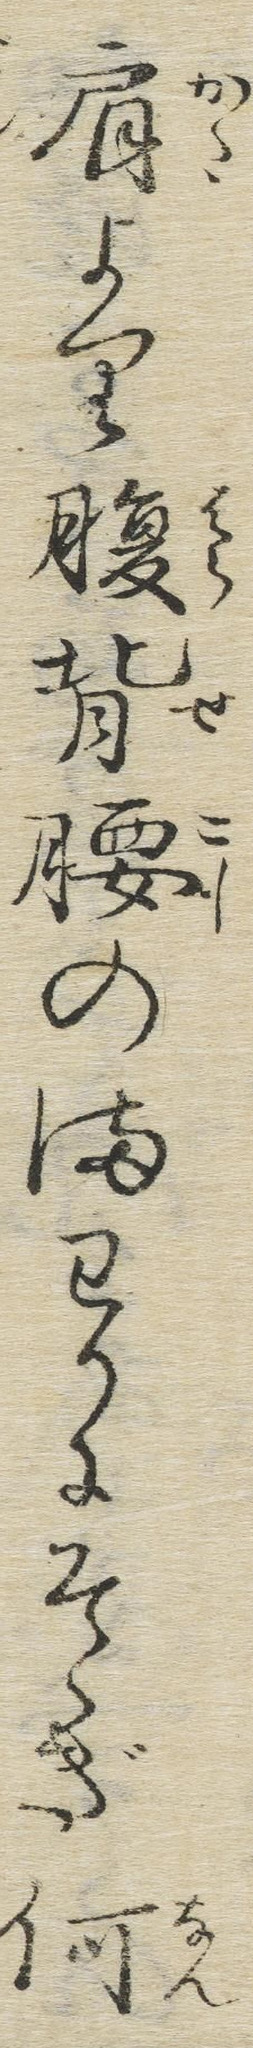肩より腹背腰のまわりにそゝぎ何
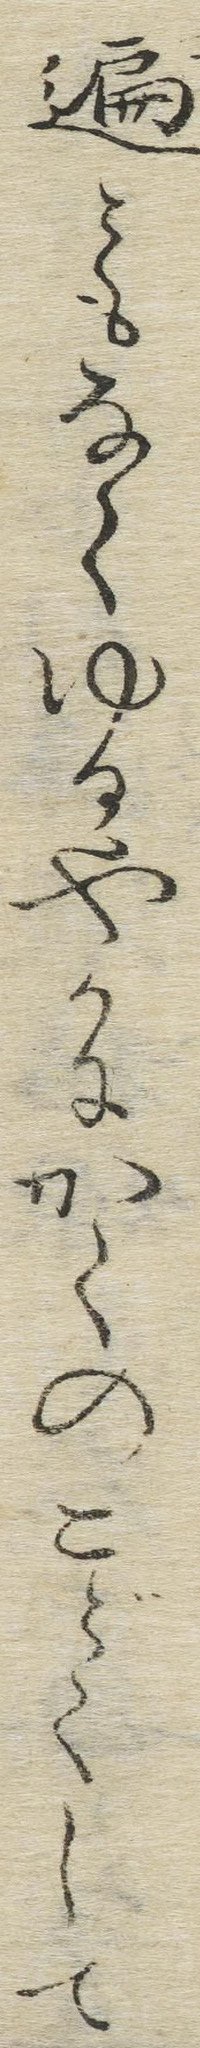遍ともなくゆるやかにかくのことくして
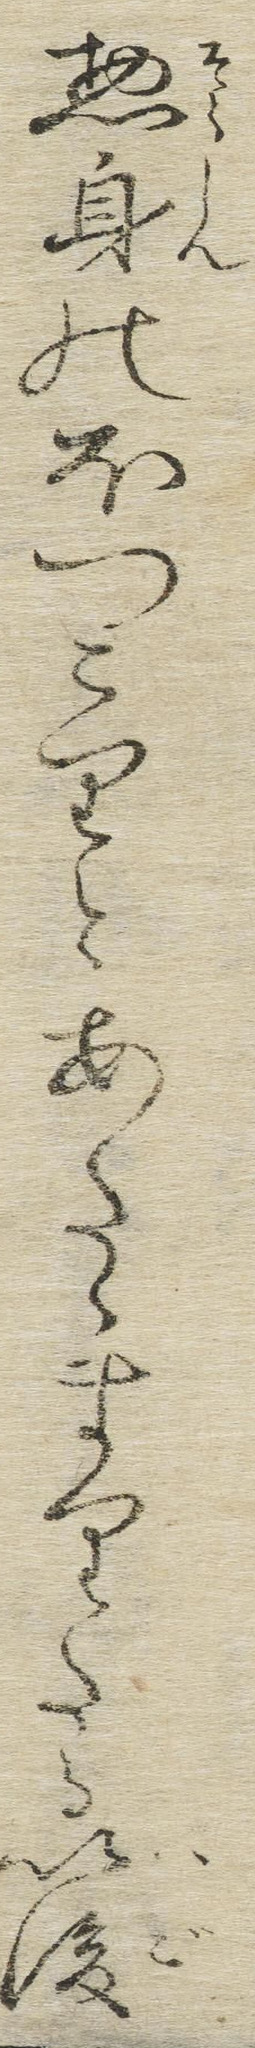惣身のほつこりとあたゝまりたる以後
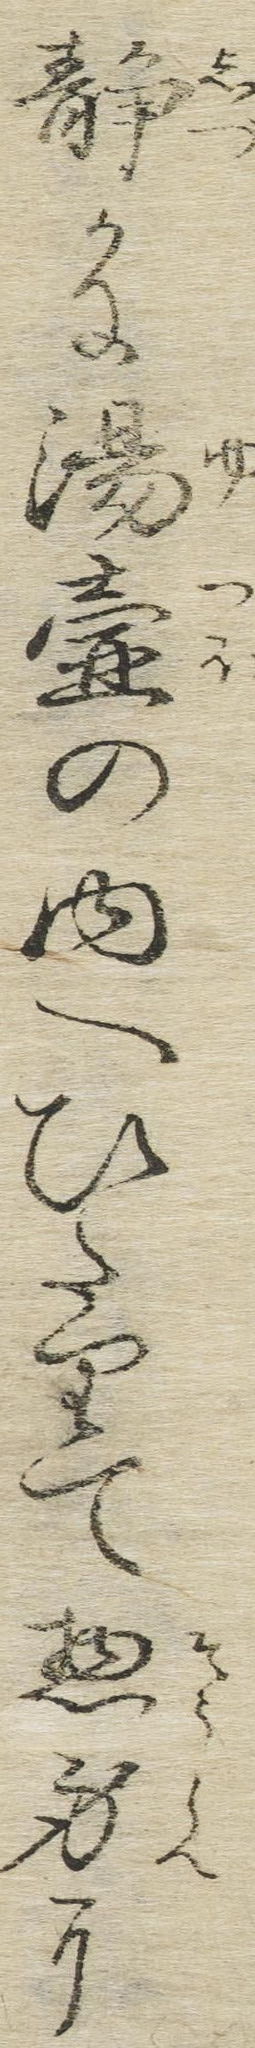静かに湯壺の内へひたりて惣身に

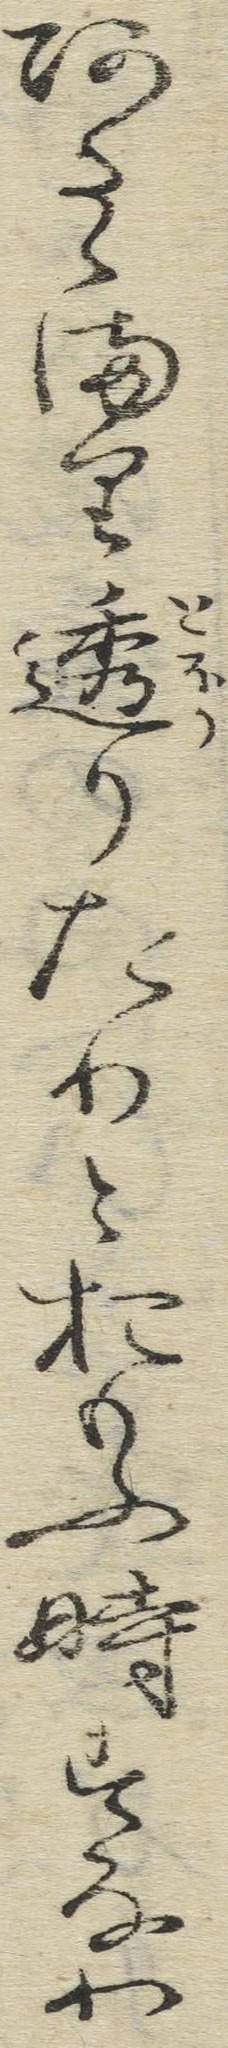あたゝまり透りたりとおもふ時すなわ
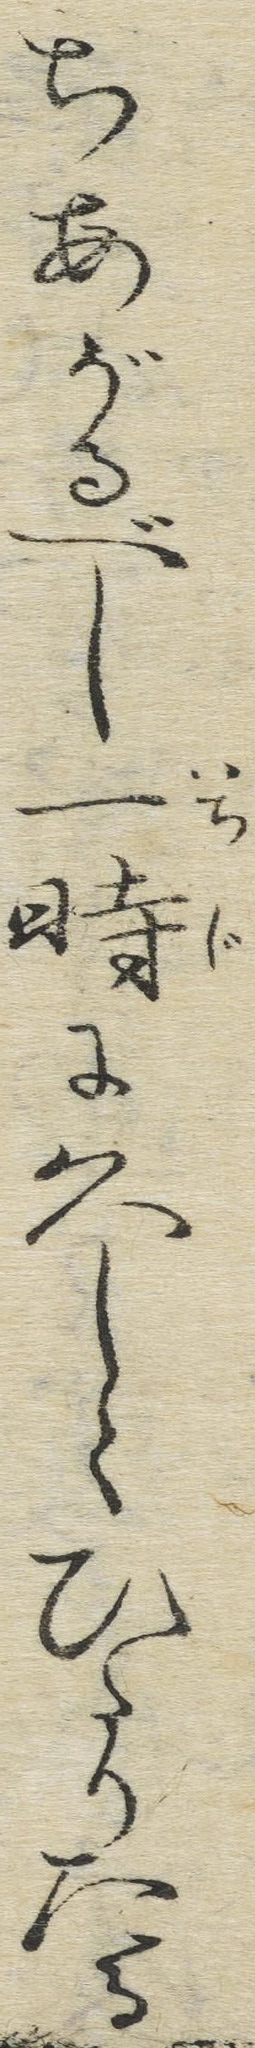ちあがるべし一時に久しくひたりたる
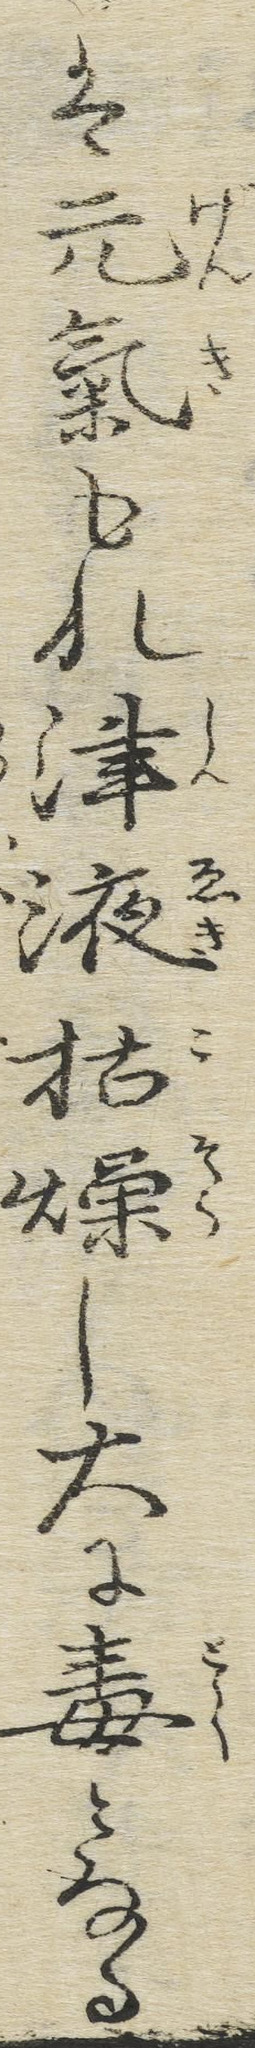は元気もれ津液枯燥し大に毒となる
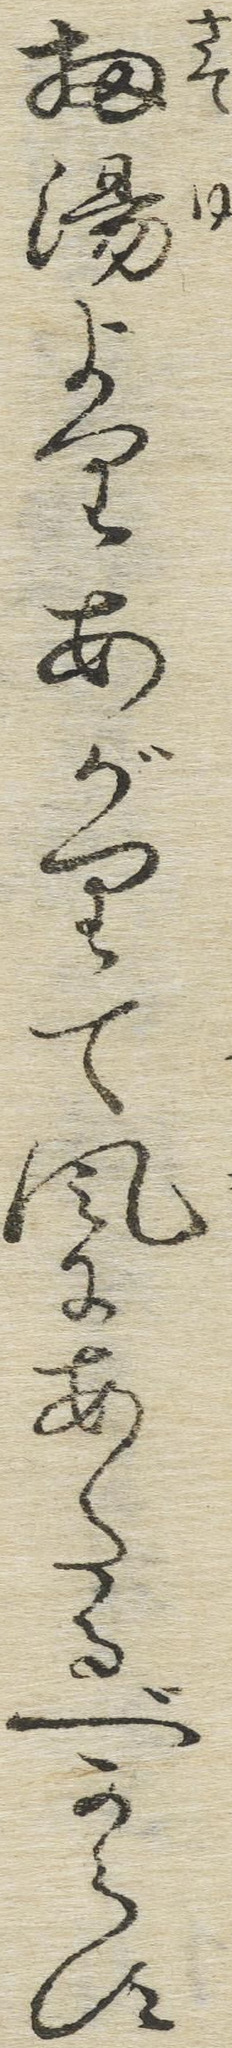扨湯よりあがりて風にあたるべからす
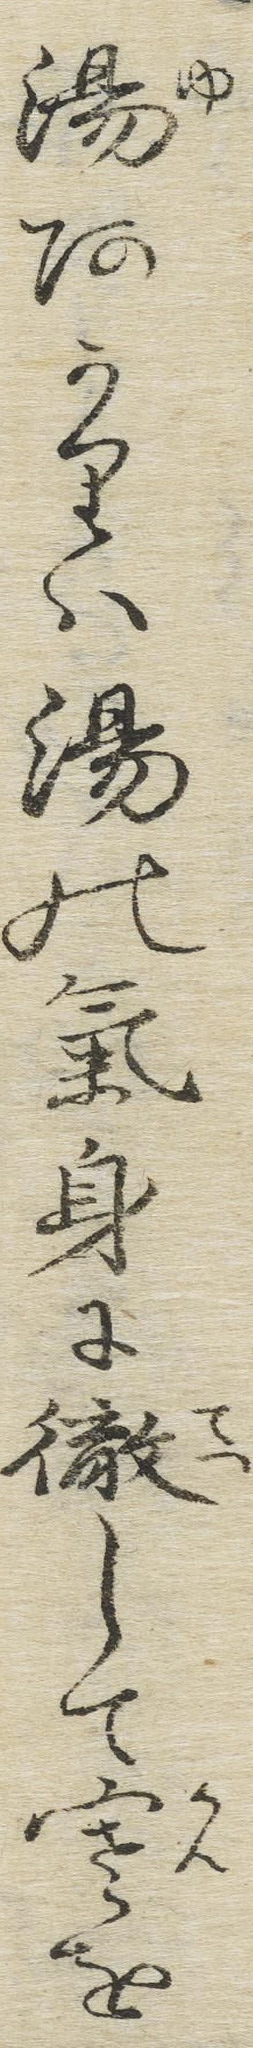湯あかりは湯の気身に徹して寒を
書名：温泉考
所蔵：東京大学地震研究所図書室 Earthquake Research Institute Library, The University of Tokyo, JAPAN
